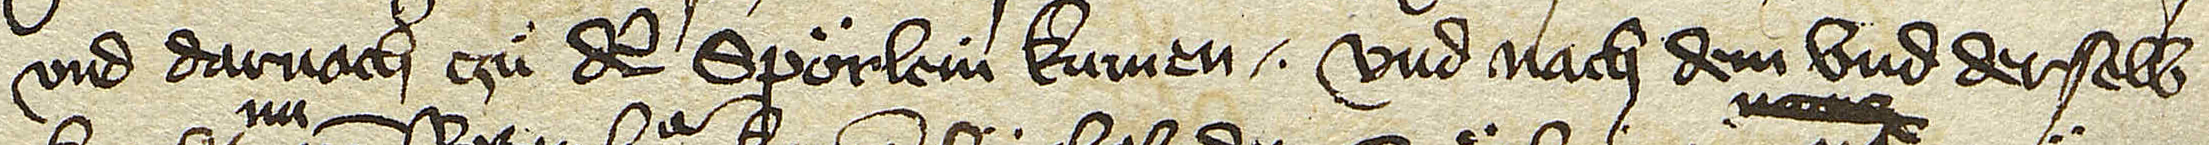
vnd darnach cʒü d* Spörlein kumen / . vnd nach dem vnd derſelb
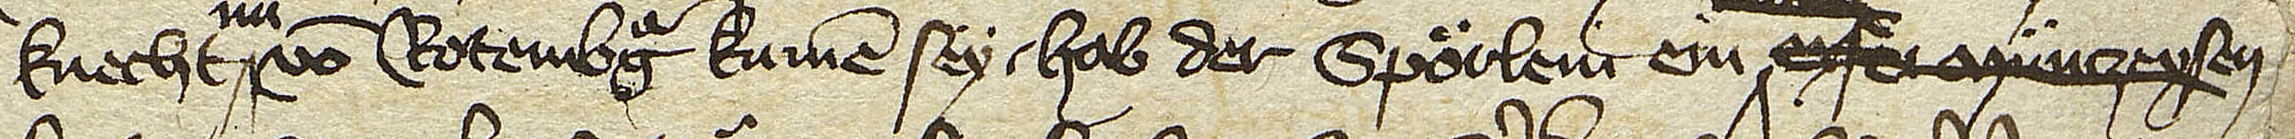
knecht vo* Rotemb*g kume* ſey / hab der Spörlein ein eyſe Müncʒeyſen
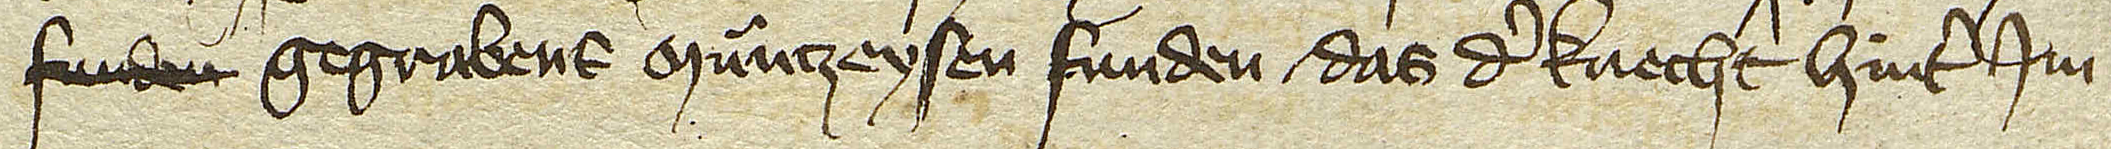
funden gegrabens Müncʒeyſen funden / das d* knecht hint* Im
